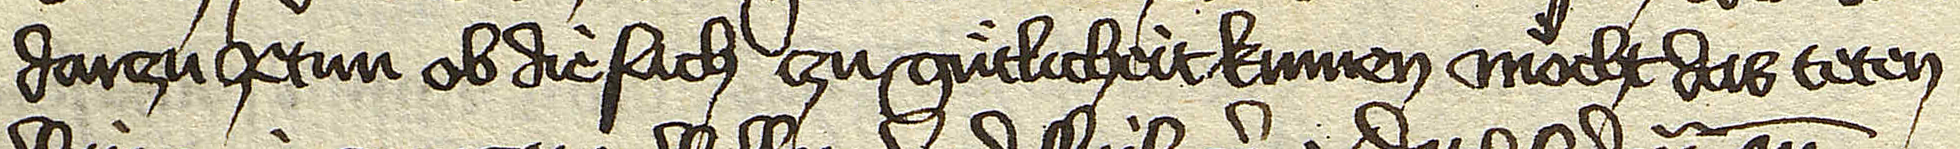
darcʒu cʒetun ob die ſach cʒu gütlicheit kumen möcht das teten
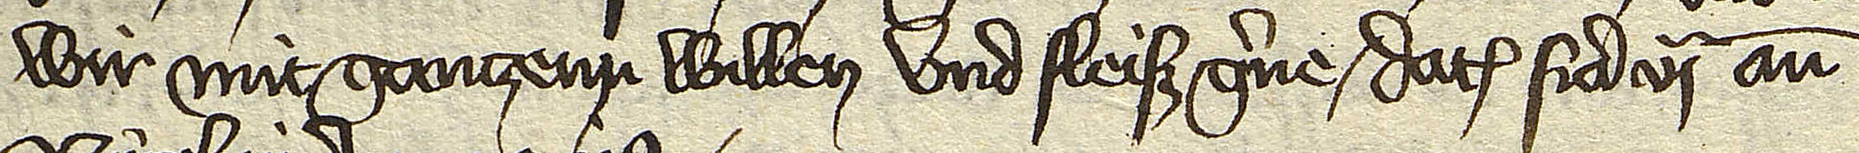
wir mit gancʒem willen vnd fleiſʒ g*ne / dat* fia* vi* an*
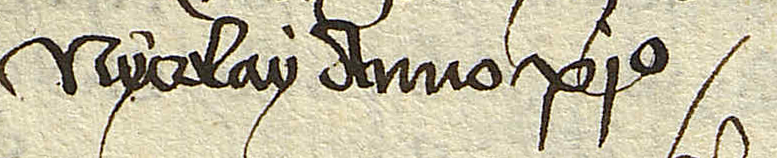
Nycolay Anno xi* /
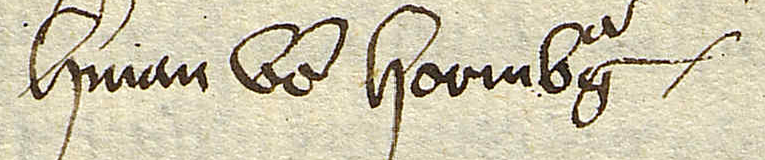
h*man vo* hormb*g /
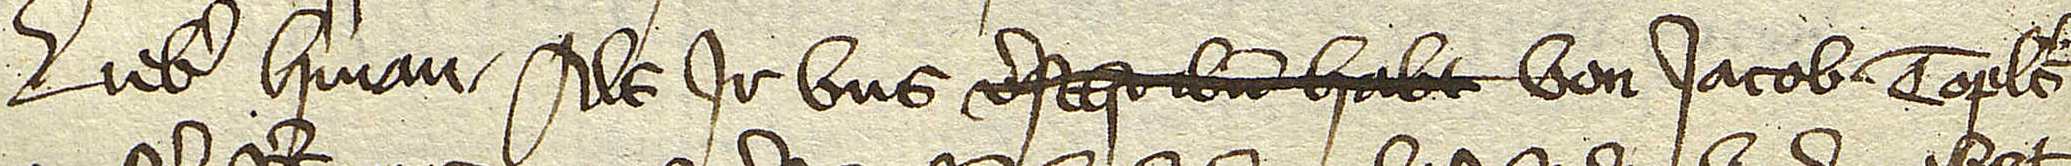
Lieb* h*man / Als Ir vns v*ſchribn* habt von Iacob Topls*
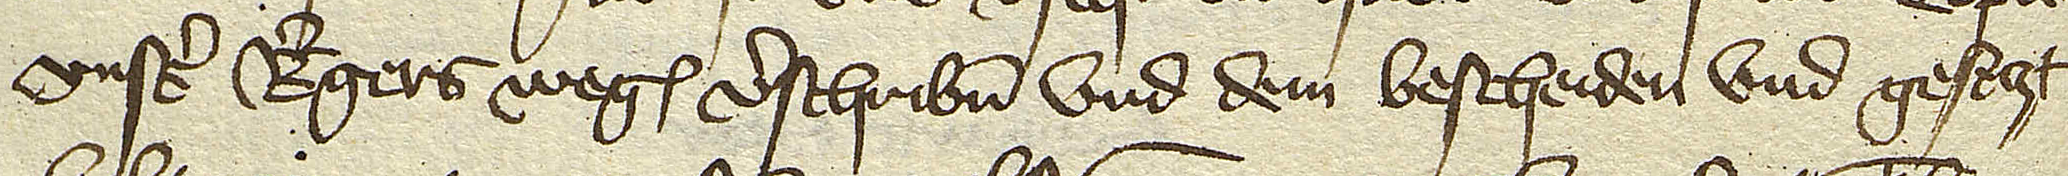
vnſs* B*gers weg* v*ſchribn* vnd dem beſcheiden vnd geſecʒt
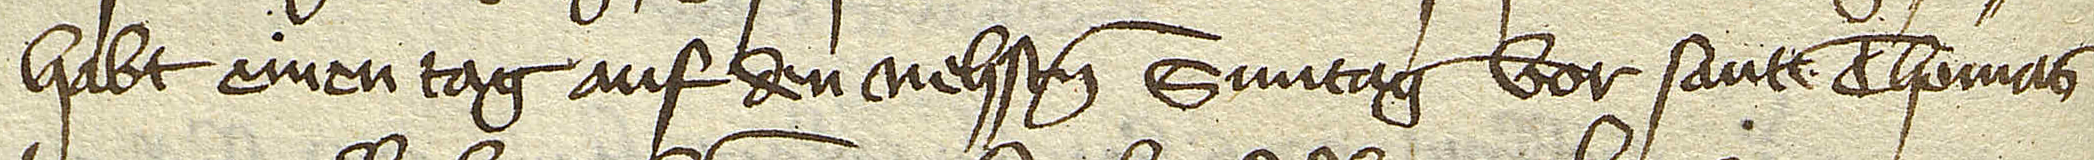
habt einen tag auf den nehſtn* Suntag vor ſant Thomas
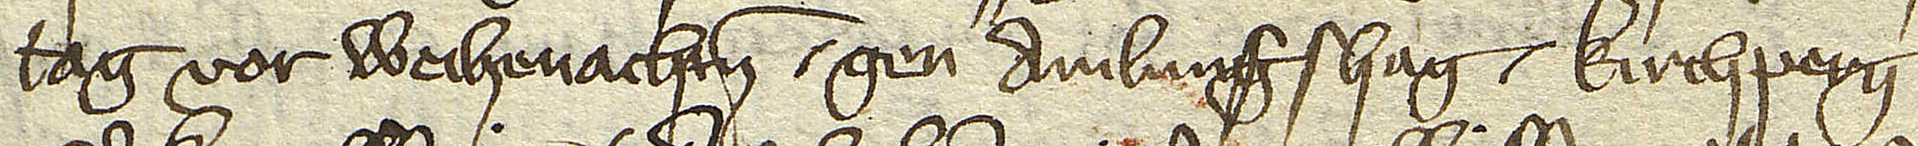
tag vor weihenachtn* / gen Amlunſſhag / kirchperg
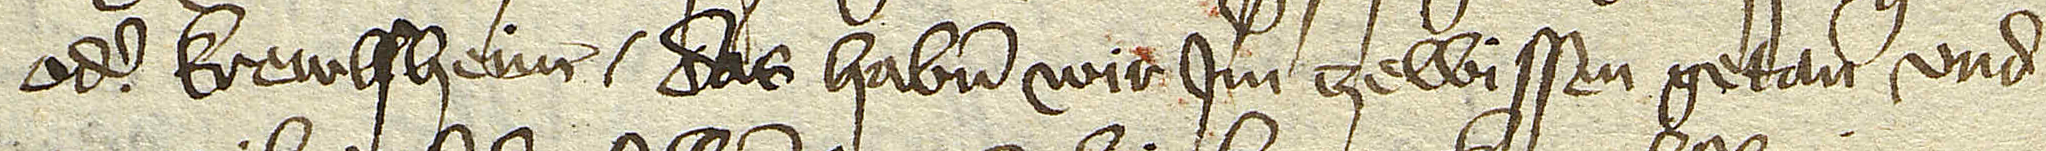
od* krewlſheim / Das habn* wir Im cʒewiſſen getan vnd
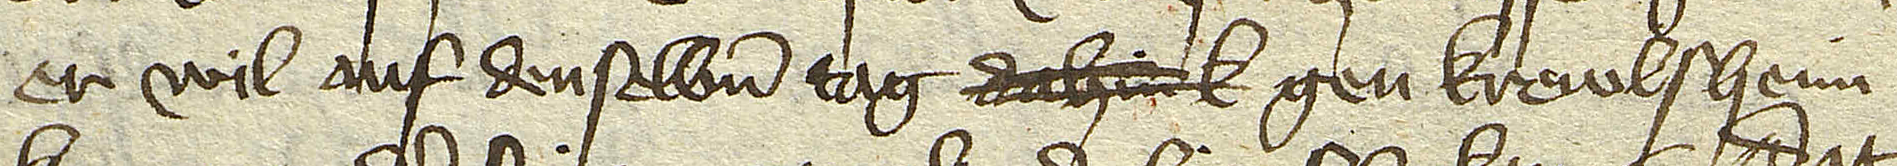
er wil auf denſelbn* tag dahin k gen krewlſheim
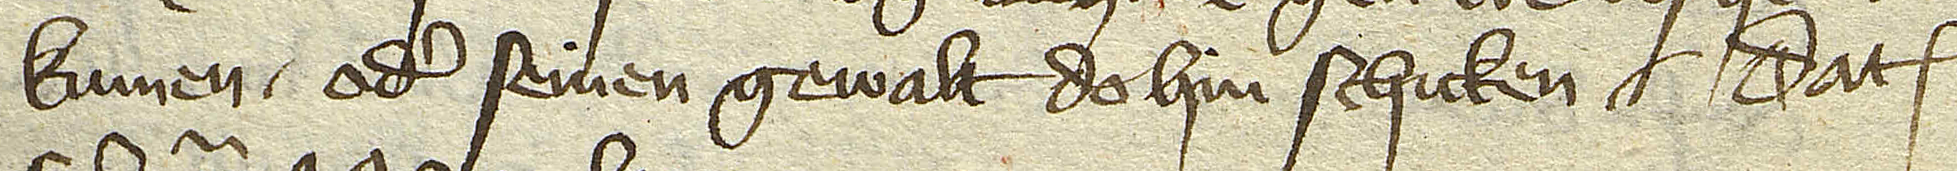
kumen / od* ſeinen gewalt do hin ſchicken / Dat*
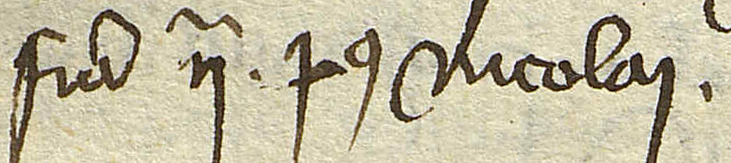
fia* ii* . p* Nicolai .
